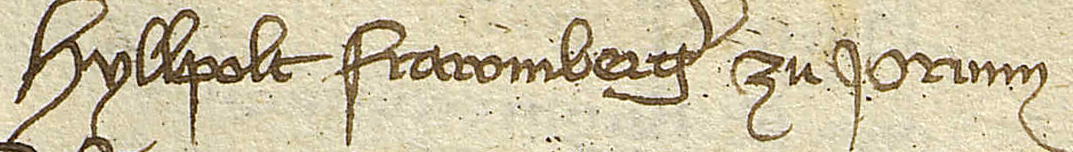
Hyllpolt Frawmberg* cʒu Prunn
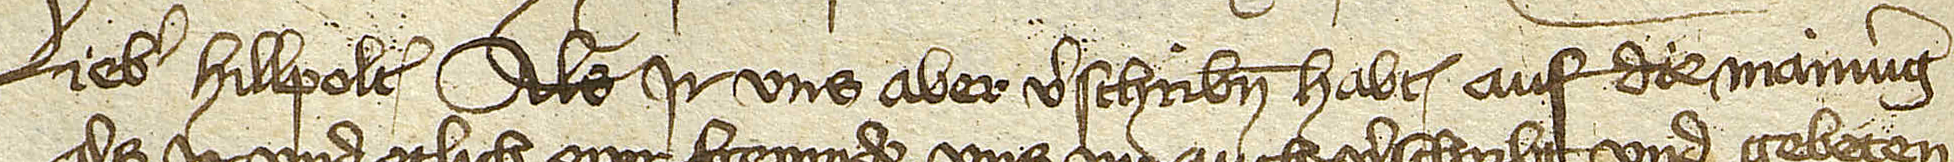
Lieb* hillpolt Als Ir vns aber v*ſchribn* habt auf die mainug*
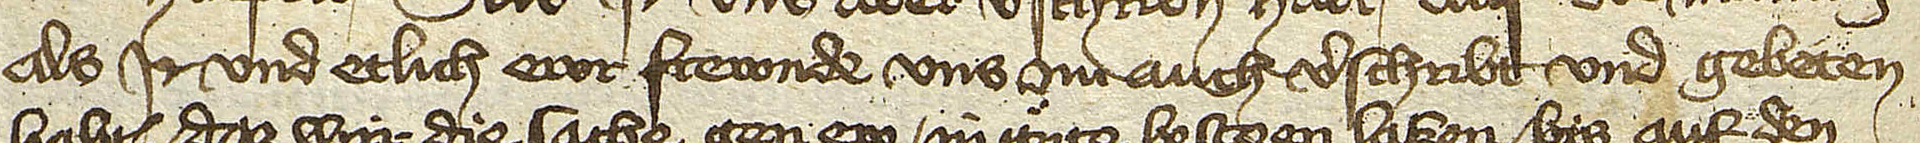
als Ir vnd etlich ewr frewnde vnd nu auch v*ſchribt vnd gebeten
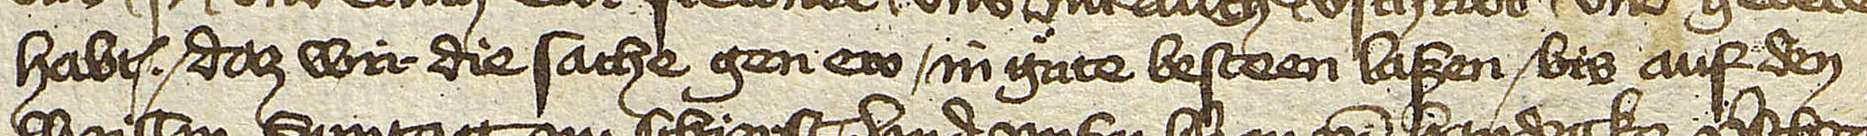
habt . / daʒ wir die ſache gen ew / in güte beſteen laſʒen / bis auf den
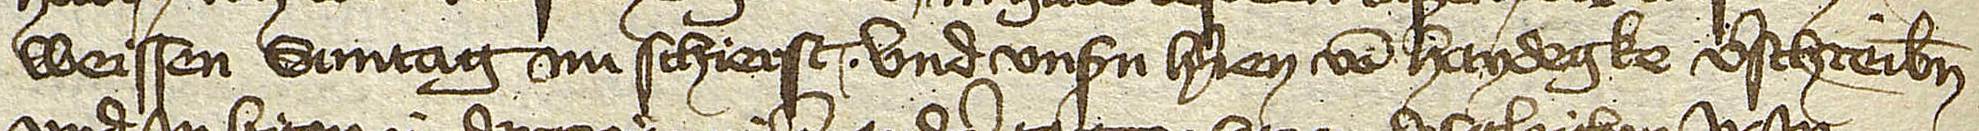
weiſſen Suntag nu ſchierſt . vnd vnſ*n h*ren w* haydegke v*ſchreibn*
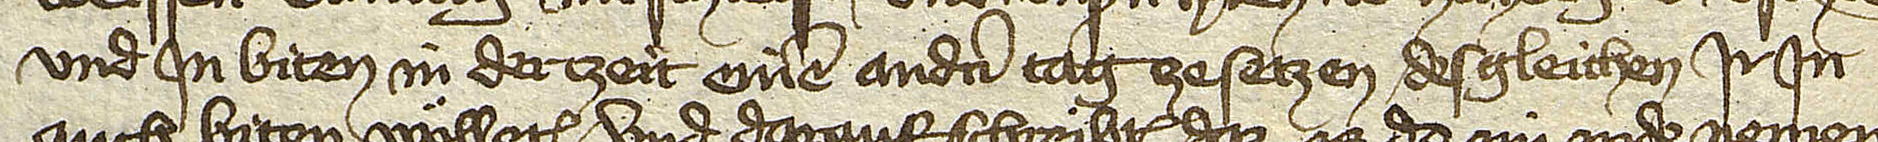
vnd In biten in dercʒeit eine* andn* tag cʒeſecʒen deſgleichen Ir In
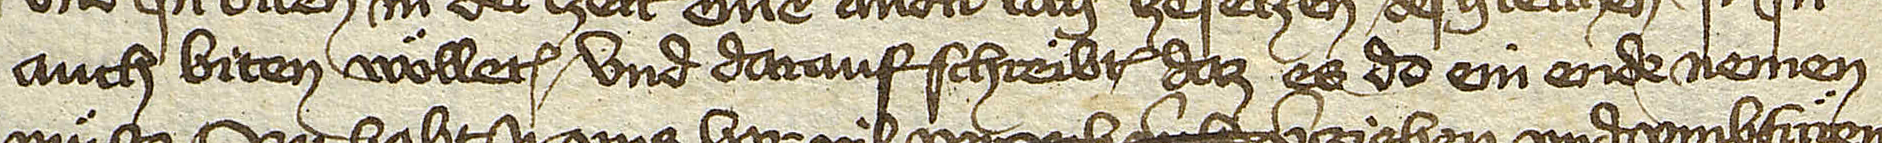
auch biten wöllet / vnd darauf ſchreibt / daʒ es do ein ende nemen
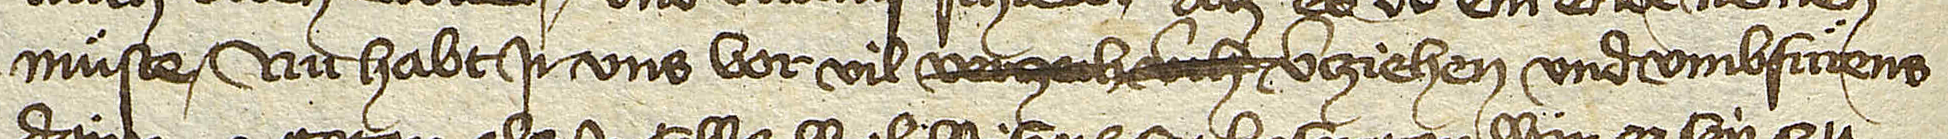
müſte / Nu habt Ir vns vor vil vercʒeih v*ch v*cʒiehen vnd vmbfürens
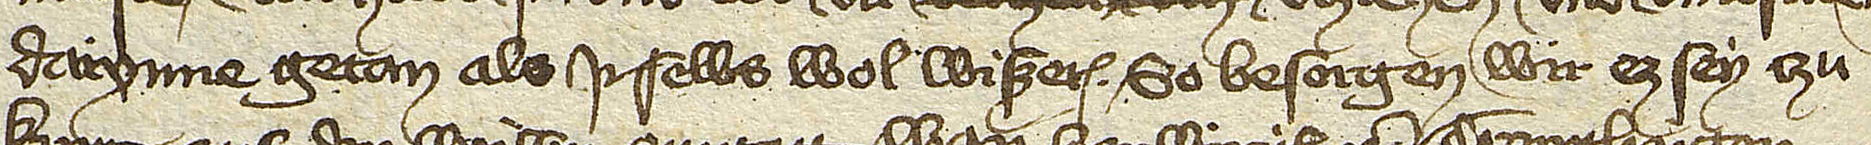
darynne getan als Ir ſelbs wol wiſʒet . / So beſorgen wir eʒ ſey cʒu
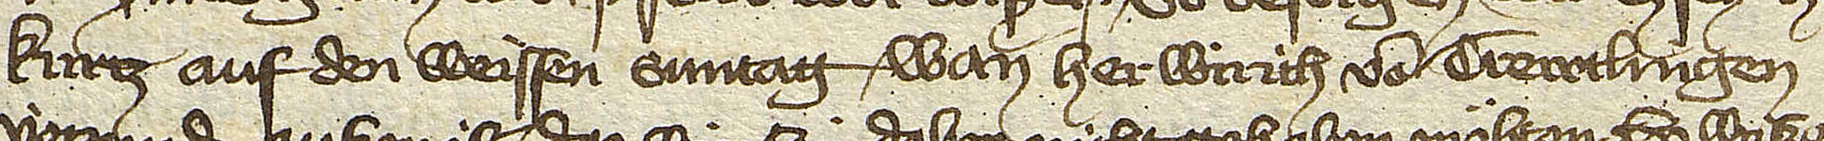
kurcʒ auf den weiſſen Suntag / wan her wirich vo* Trewtlingen
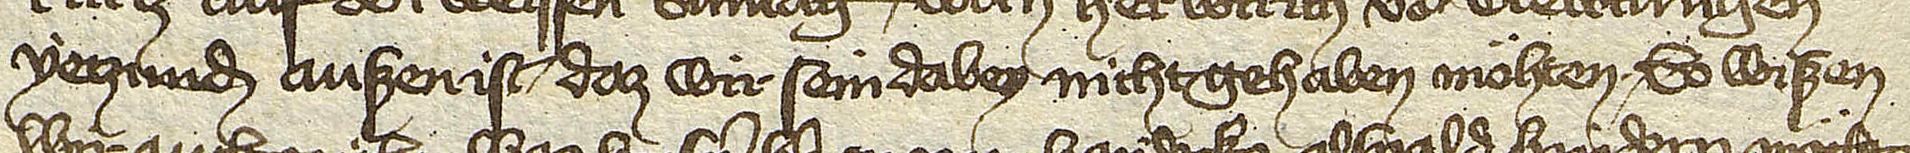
yecʒund* auſʒen iſt / daʒ wir ſein dabey nicht gehaben möhten / So wiſʒen
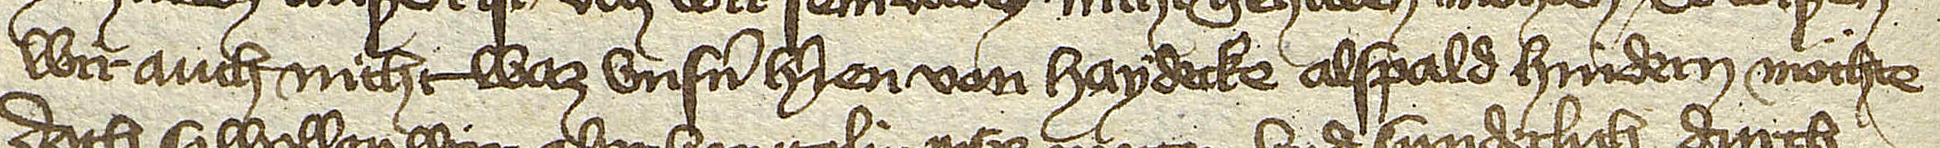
wir auch nicht waʒ vnſn* h*ren von haydecke alſpald hindern möchte
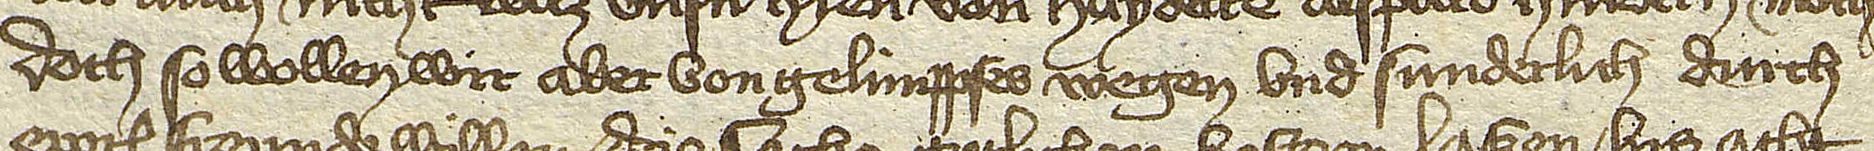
doch ſo wollen wir aber von gelimppfes wegen vnd ſunderlich durch
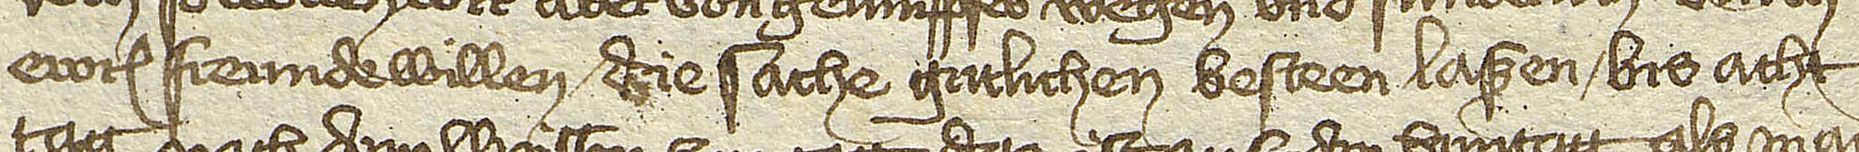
ewr* freunde willen / die ſache gutlichen beſteen laſʒen / bis acht
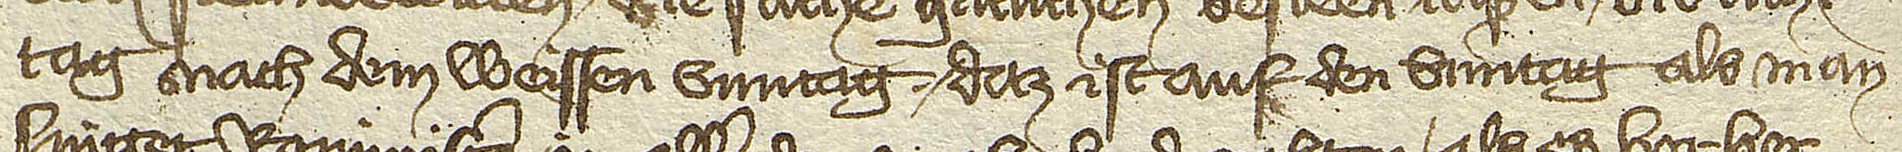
tag nach dem weiſſen Suntag . / daʒ iſt auf den Suntag als man
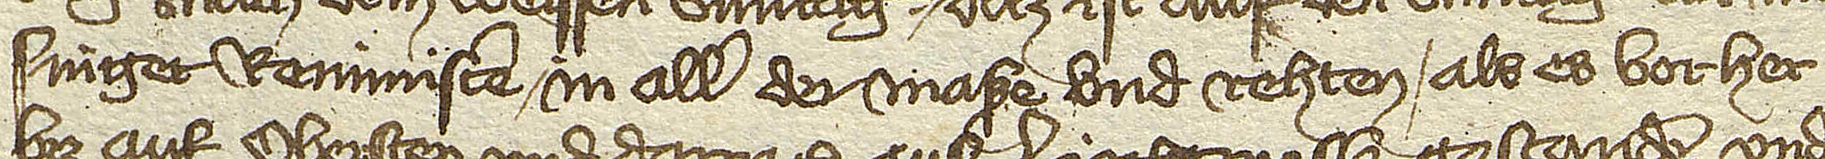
finger Renimiſce* in all* der maſʒe vnd rehten / als es vor her
